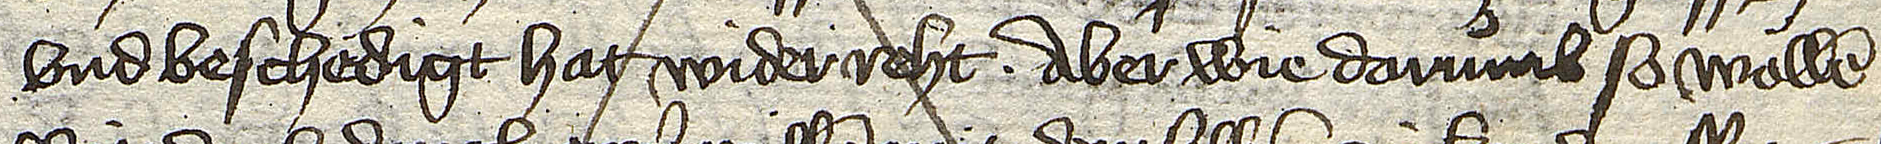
vnd beſchedigt hat wider reht . Aber wir darümb ſo wölle*
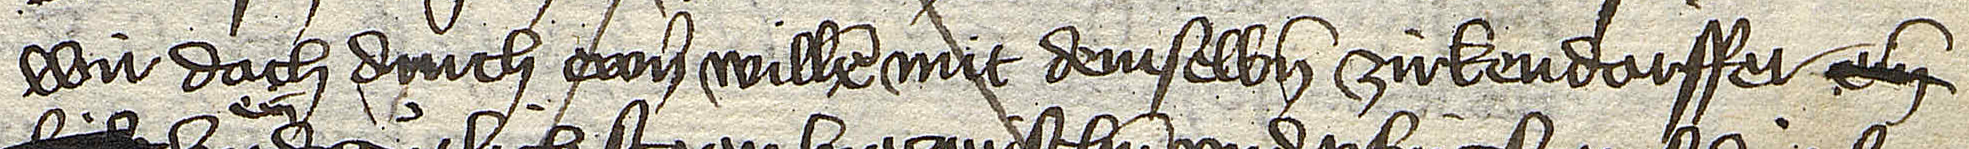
wir doch durch ew*n wille* mit demſelbn* cʒirkendorffer ein*
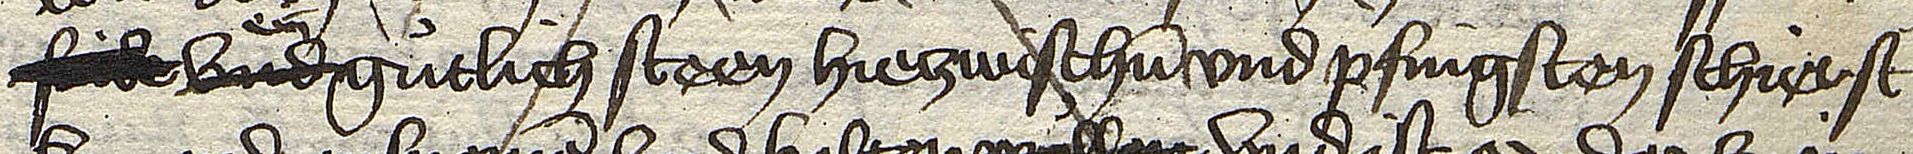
fride vnd gütlich ſteen hiecʒwiſchn* vnd pfingſten ſchierſt
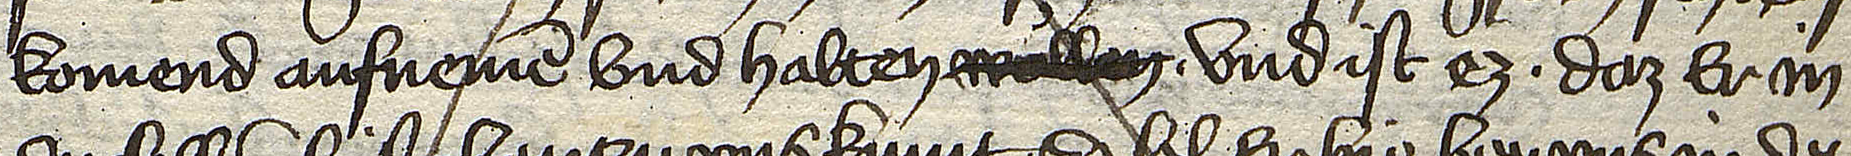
komend aufneme* vnd halten wöllen . vnd iſ eʒ . daʒ Er in
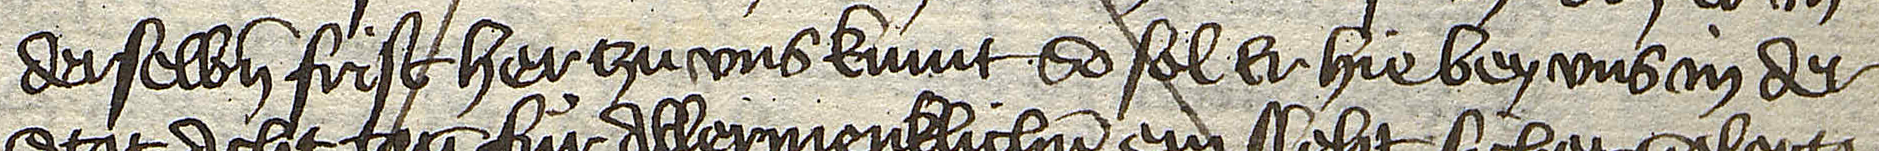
derſelbn* friſt her cʒu vns kumt . So ſol Er hie bey vns in der
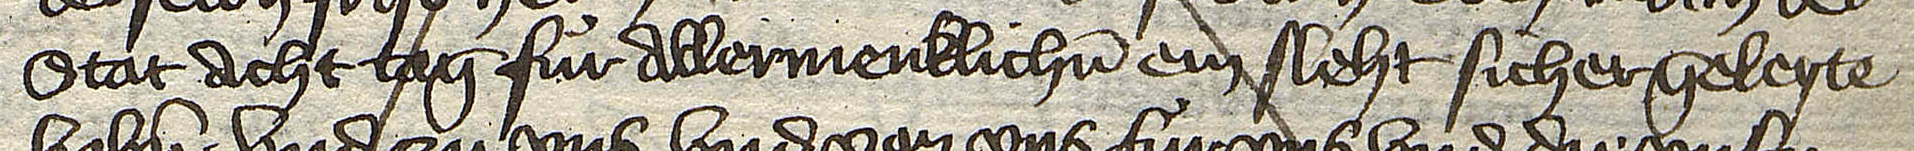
Stat Acht tag für Allermenklichn* ein ſleht ſicher geleyte
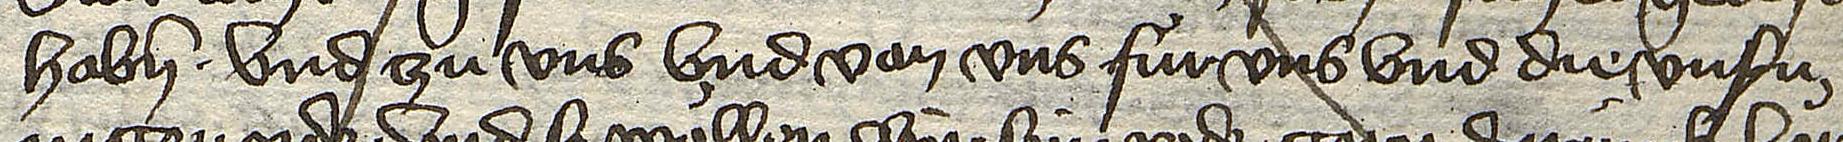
habn* . vnd cʒu vns vnd von vns für vns vnd die vnſ*n
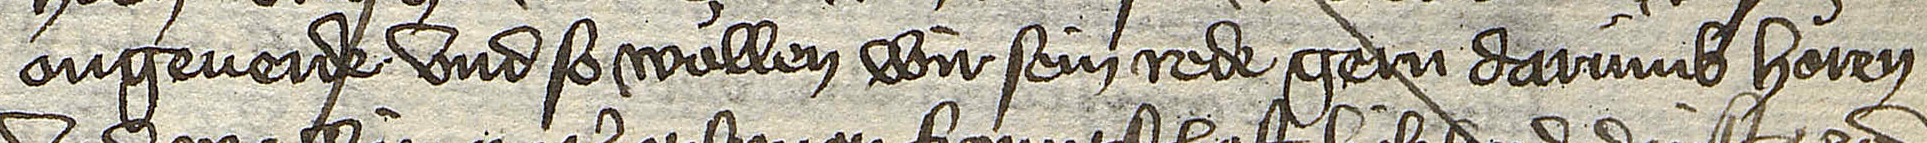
ongeuerde . Vnd ſo wöllen wir ſein rede gern darümb hören
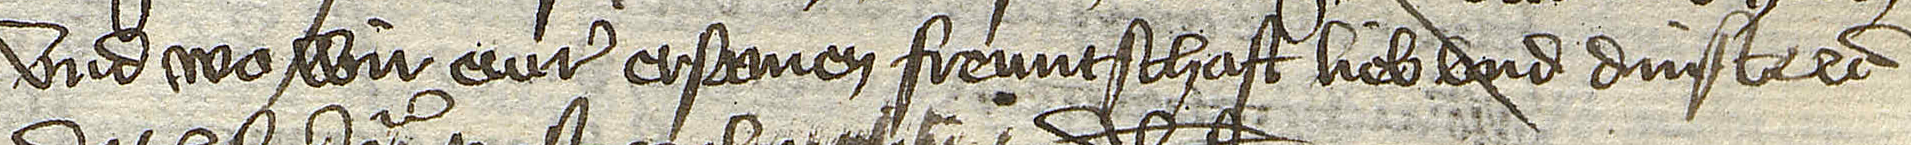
vnd wo wir ewr* erſamen freuntſchaft lieb vnd dienſte ec*
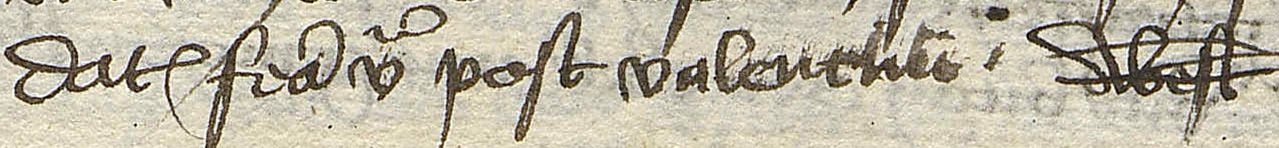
Dat* fea* v* poſt valentini Abeſt
